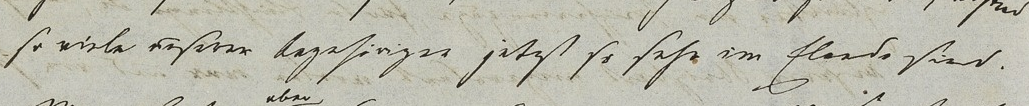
so viele unserer Angehörigen jetzt so sehr im Elende sind.
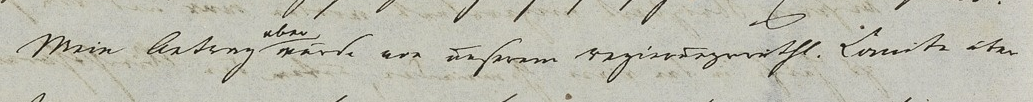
Mein Antrag aber wurde von unserem regierungsräthl. Comite über
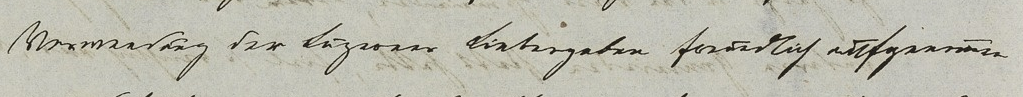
Verwendung der Luzerner Liebesgaben freundlich aufgenommen
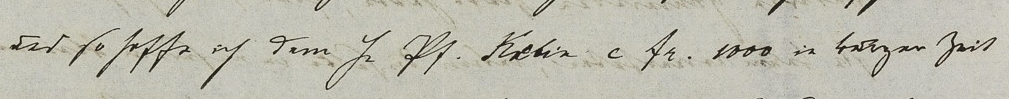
und so hoffe ich dem H. Pf. Kælin c. fr. 1000 in kurzer Zeit
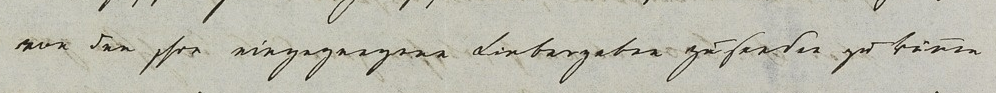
von den schon eingegangnen Liebesgaben zusenden zu können
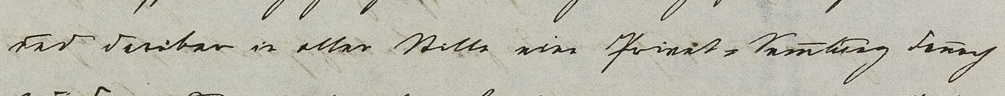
und darüber in aller Stille eine Privat-Sammlung dennoch
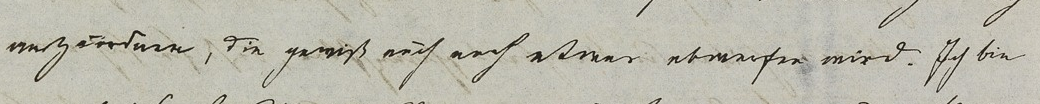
anzuordnen, die gewiß auch noch etwas abwerfen wird. Ich bin
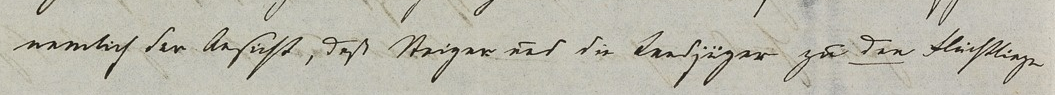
nemlich der Ansicht, daß Steiger und die Landjäger zu den Flüchtlingen
